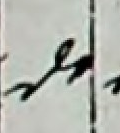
do
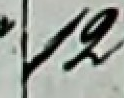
12
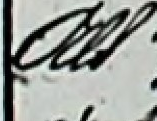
Alt
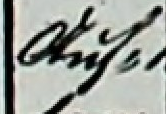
Aus„
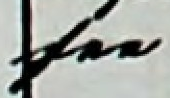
see
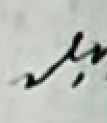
do
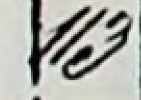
113
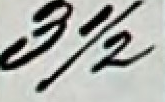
3 ½
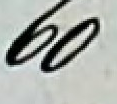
60
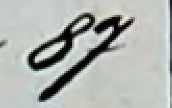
87
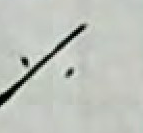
./.
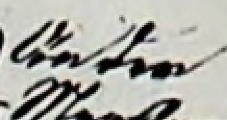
An der
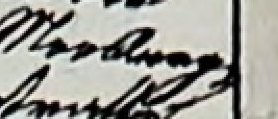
Marsberg
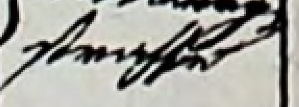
straffe
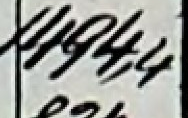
1494,4
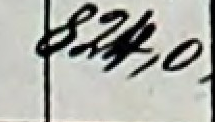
824,0
